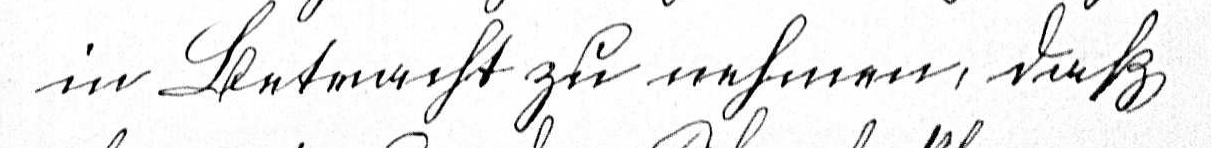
in Betracht zu nehmen, daß
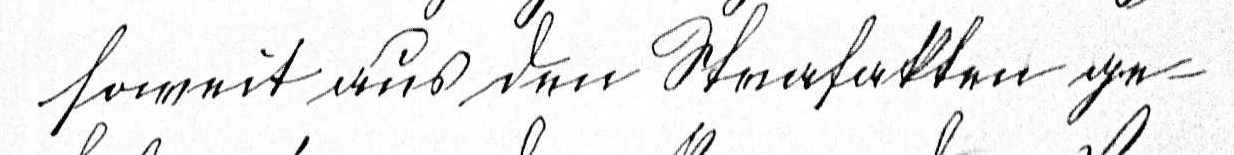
soweit aus den Strafakten ge¬
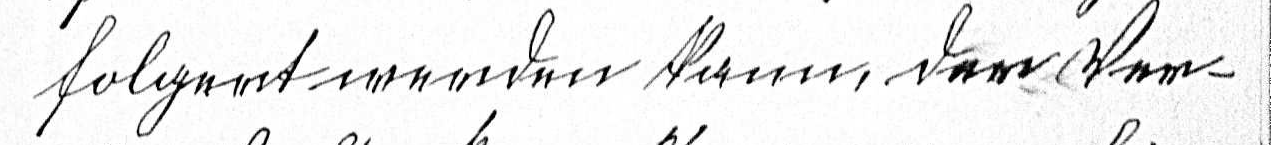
folgert werden kann, der Ver¬
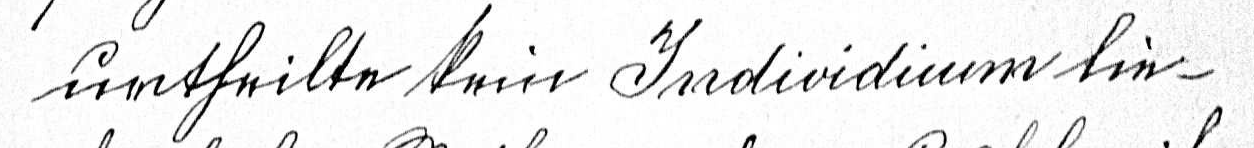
urtheilte kein Individium lie¬
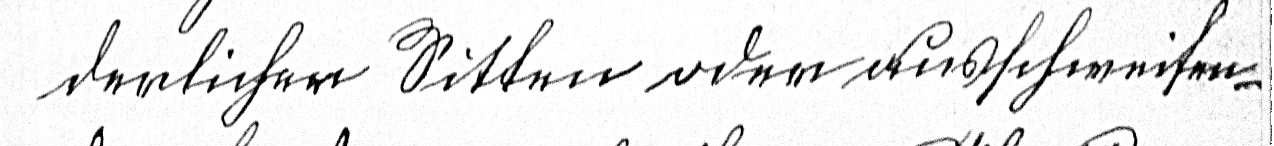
derlicher Sitten oder ausschweifen¬
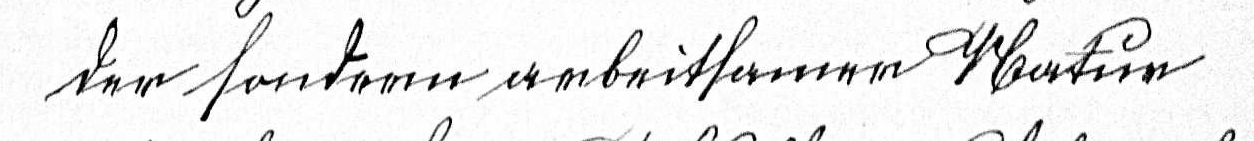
der sondern arbeitsamer Natur
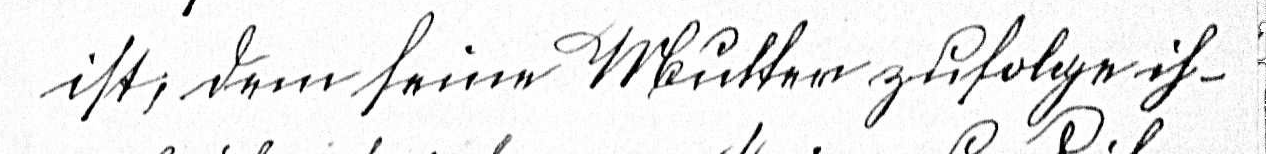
ist, dem seine Mutter zufolge ih¬
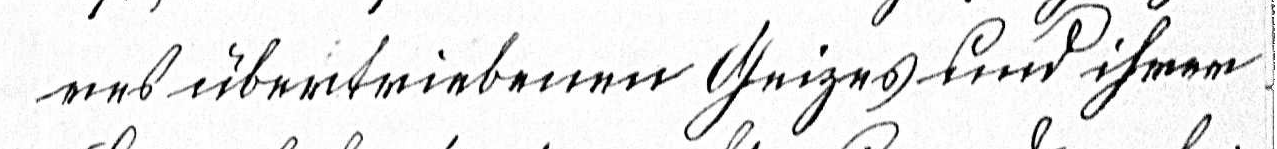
res übertriebenen Geizes und ihrer
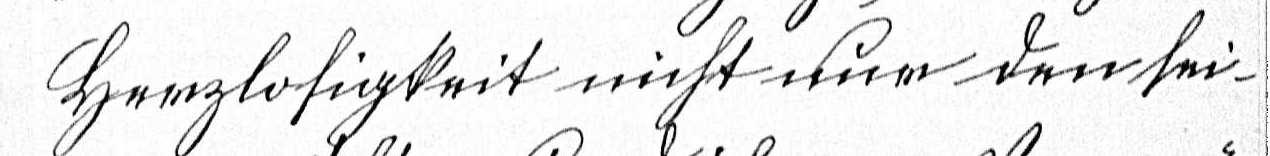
Herzlosigkeit nicht nur den sei¬
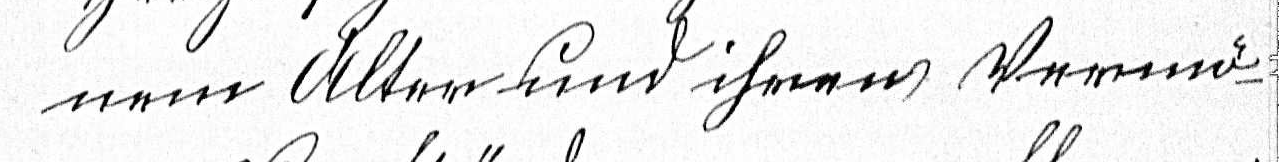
nem Alter und ihren Vermö¬
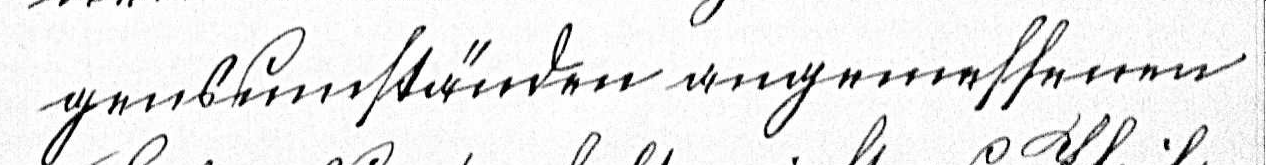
gensumständen angemessenen
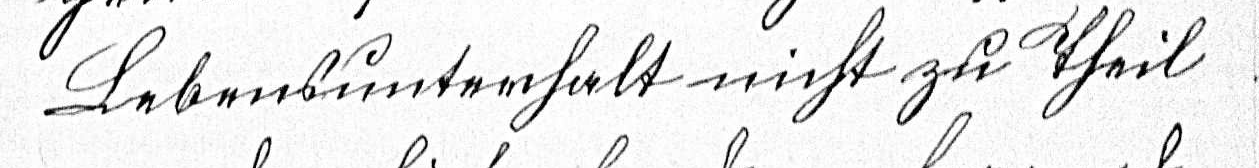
Lebensunterhalt nicht zu Theil
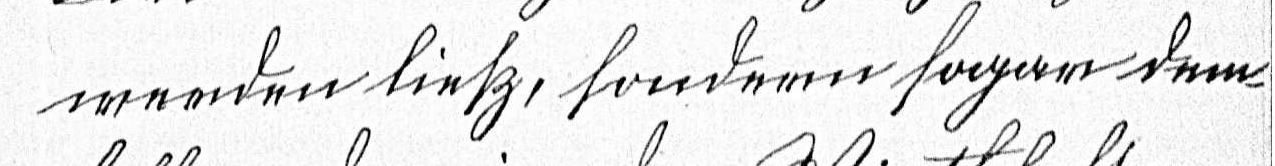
werden ließ, sondern sogar dem¬
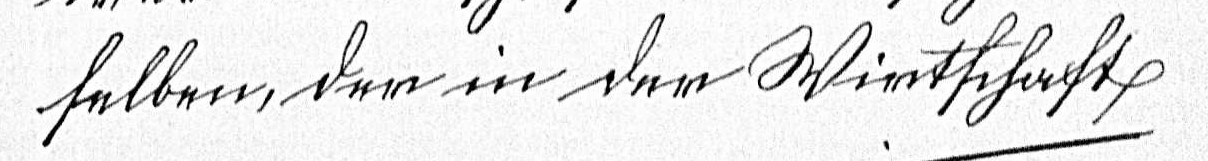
selben, der in der Wirthschaft
